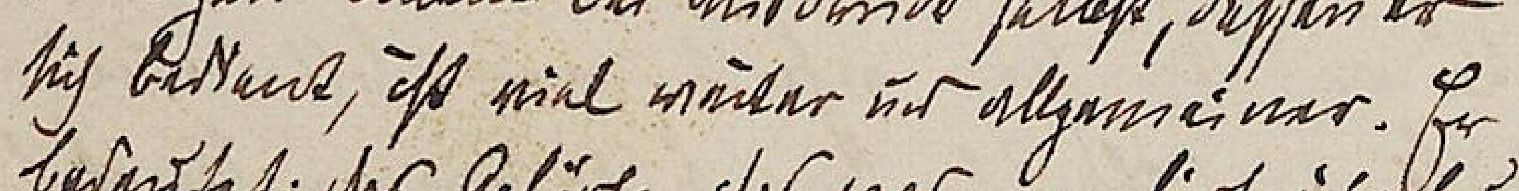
sich bedient, ist viel weiter und allgemeiner. Er
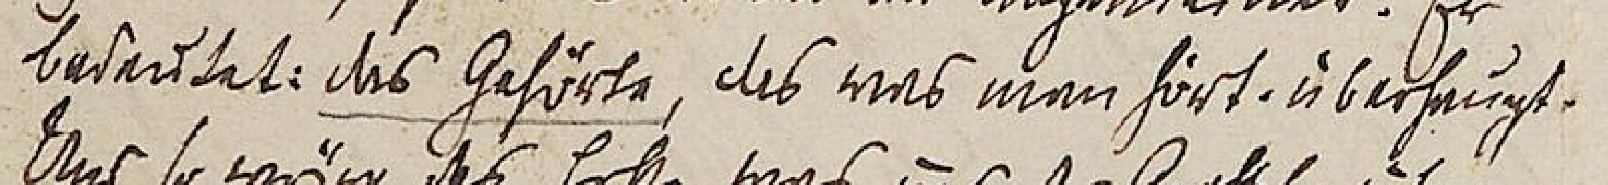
bedeutet: das Gehörte, das was man hört. überhaupt.
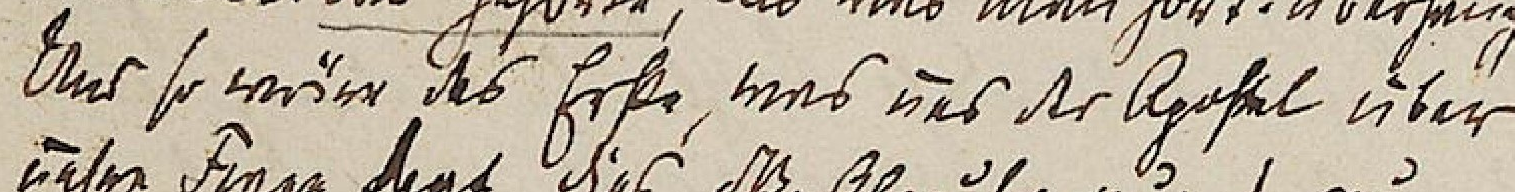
Und so wäre das Erste, was uns der Agoel über
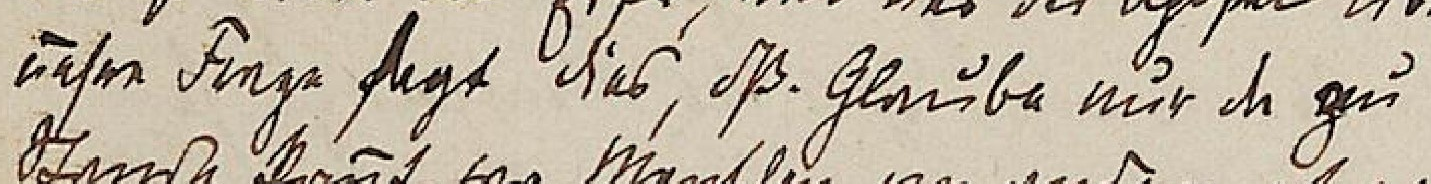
unsre Frage sagt dies, daß Glaube nur da zu
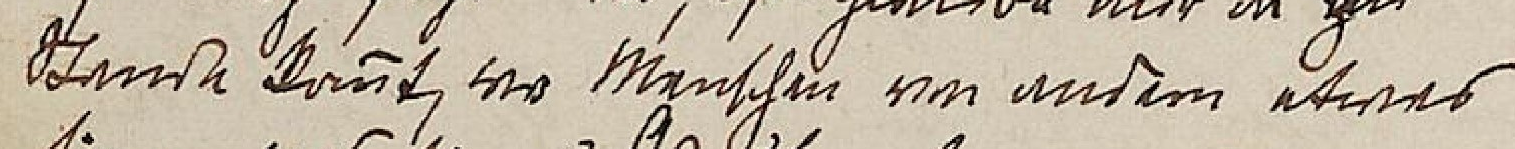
Stande kommt, wo Menschen von andern etwas
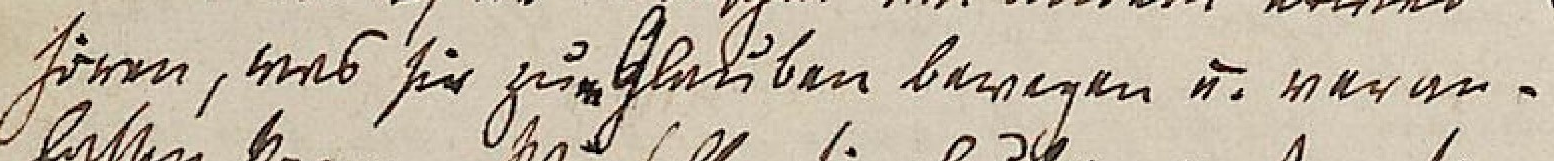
Hören, was sie zum Glauben bewegen u. veran¬
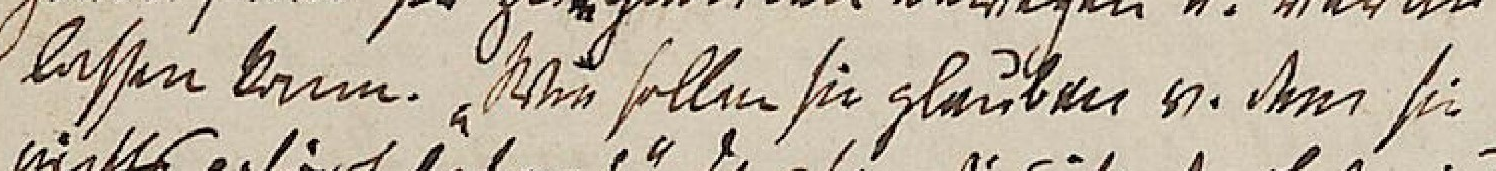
lassen kann. Wie sollen sie glauben v. dem sie
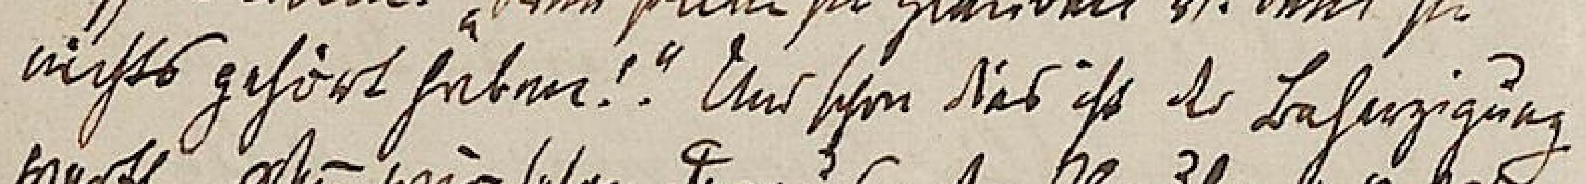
nichts gehört haben!" Und schon das ist der Beherzigung,
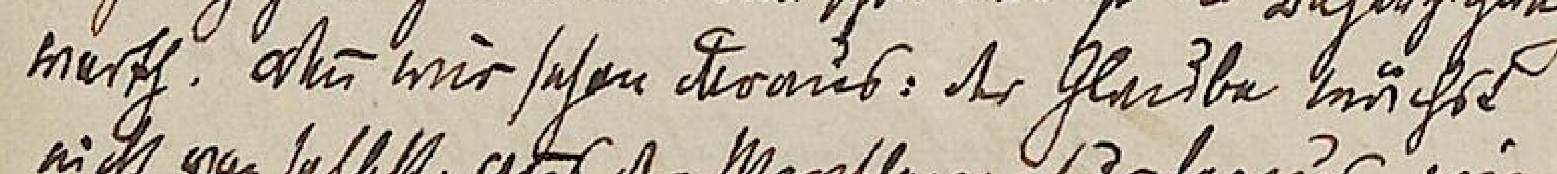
Wert. Den wir sehen daraus: der Glaube wächst
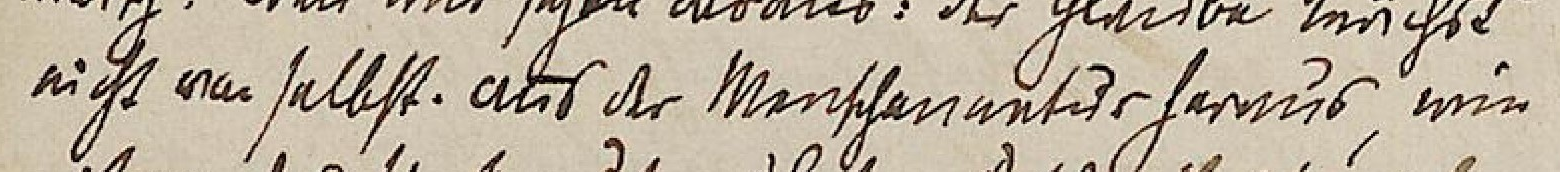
nicht von selbst aus der Menschennatur heraus, wie
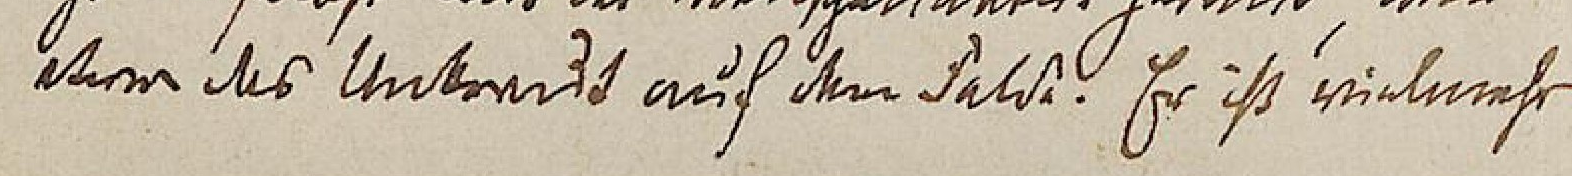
etwa das Unkraut auf dem Felde! Er ist vielmehr
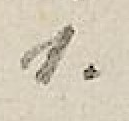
1.
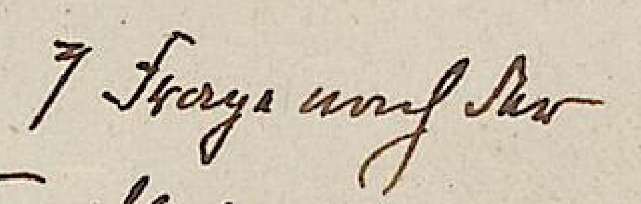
] Frage nach der
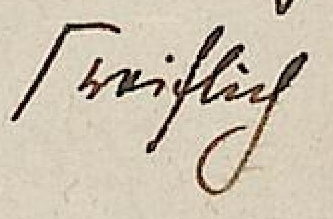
[ reiflich
